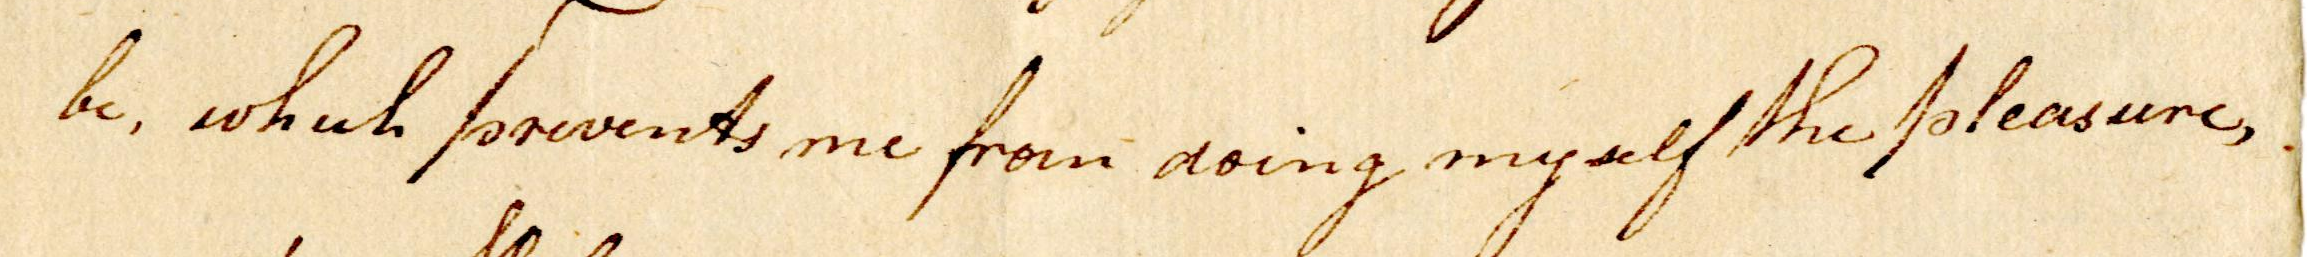be which prevents me from doing myself the pleasure
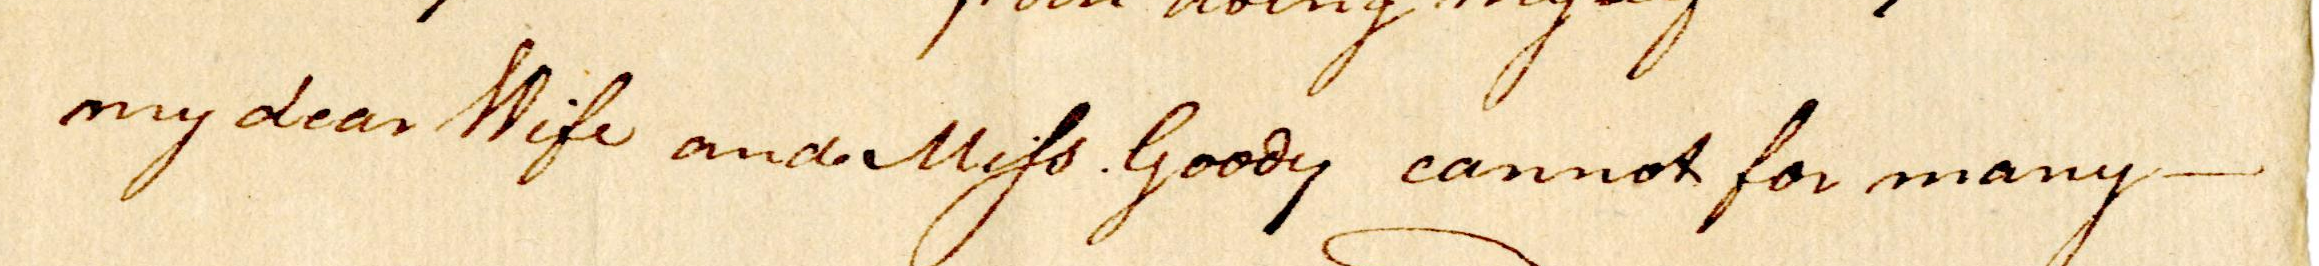my dear Wife and Miss Goody cannot for many-
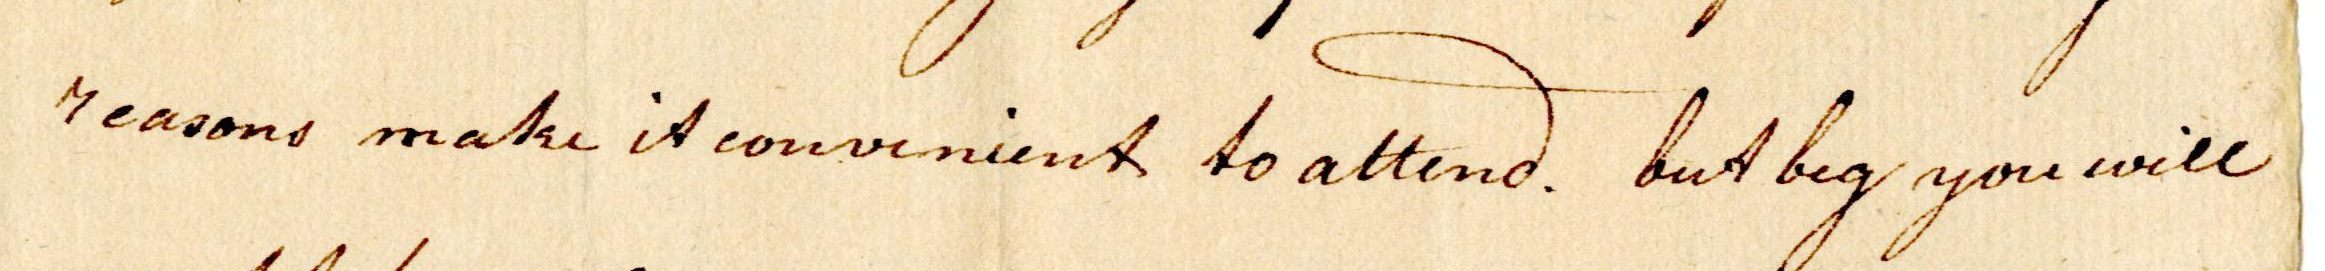reasons make it convenient to attend. But beg you will
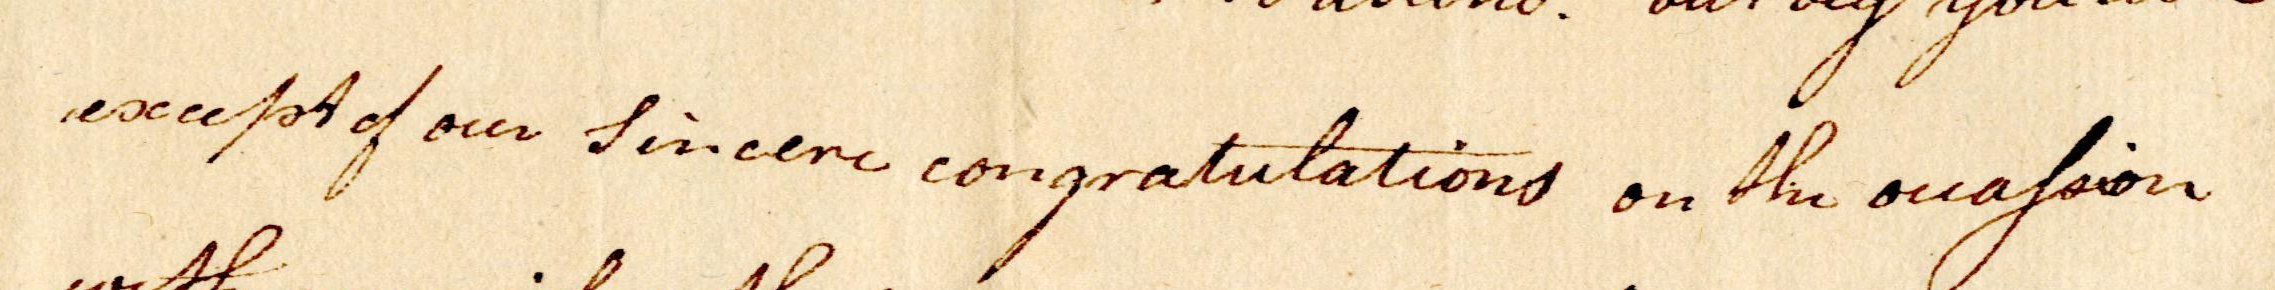except of our Sincere congratulations on the occassion
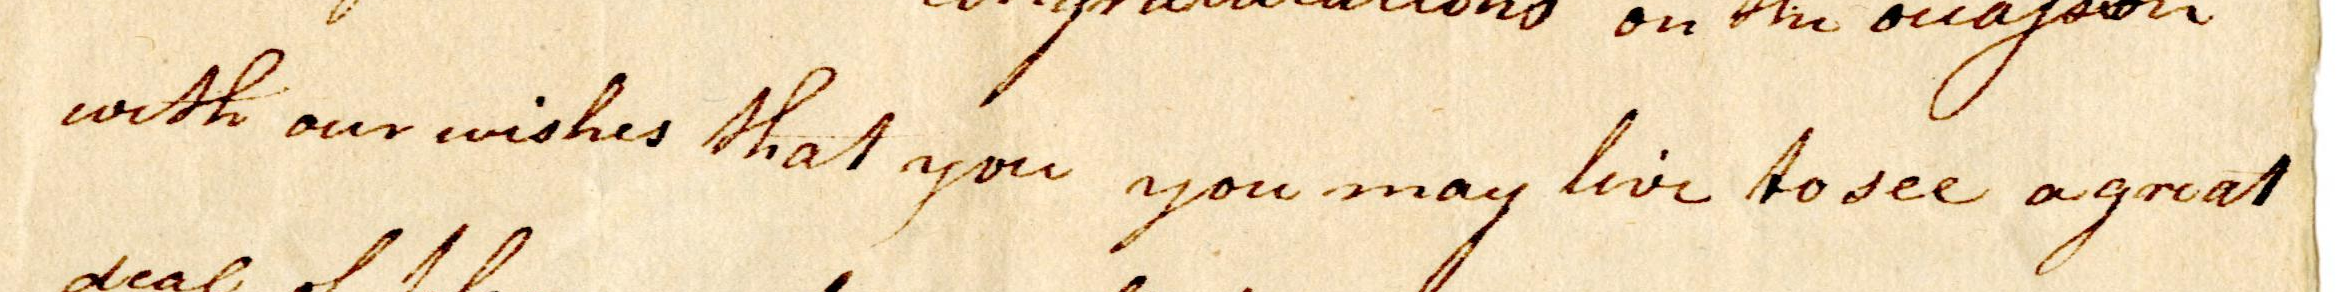with our wishes that you you may live to see a great
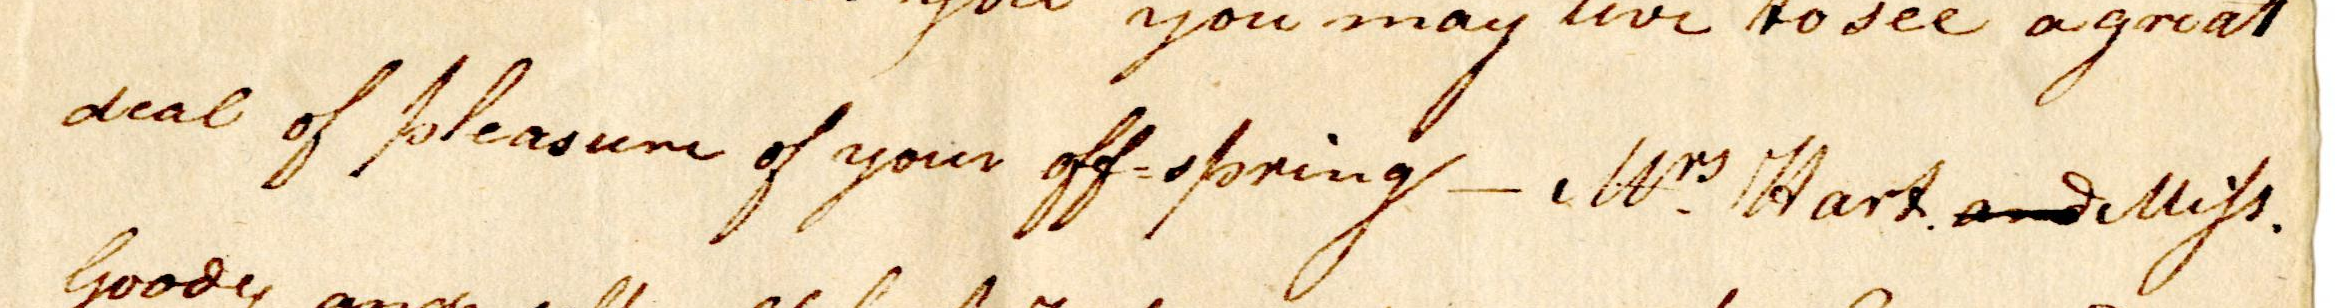deal of pleasure of your off-spring.- M^rs. Hart and Miss.
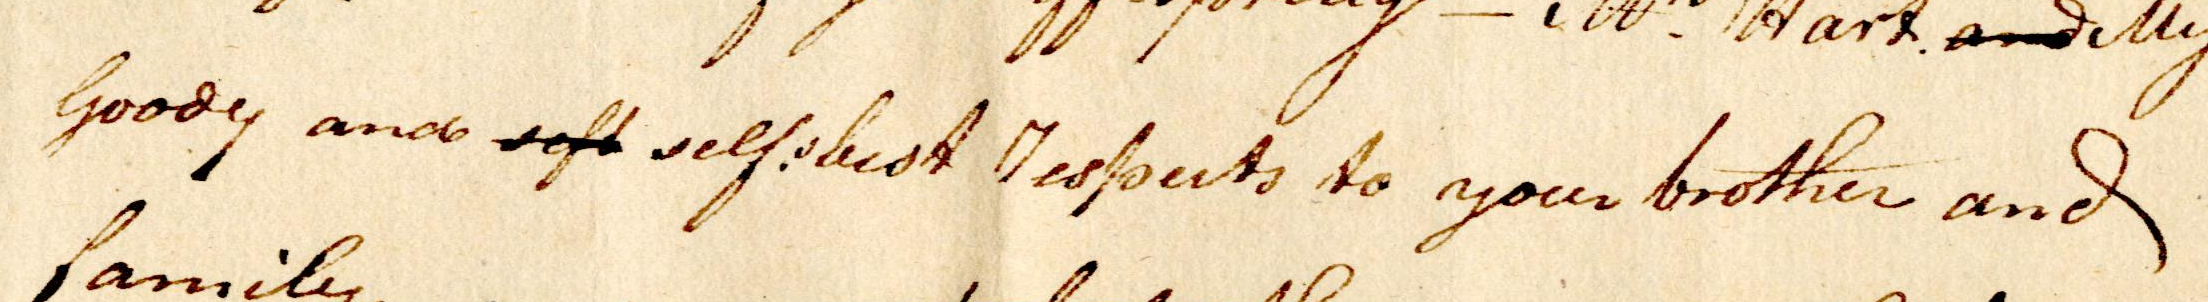Goody and [self] self.s best respects to your brother and
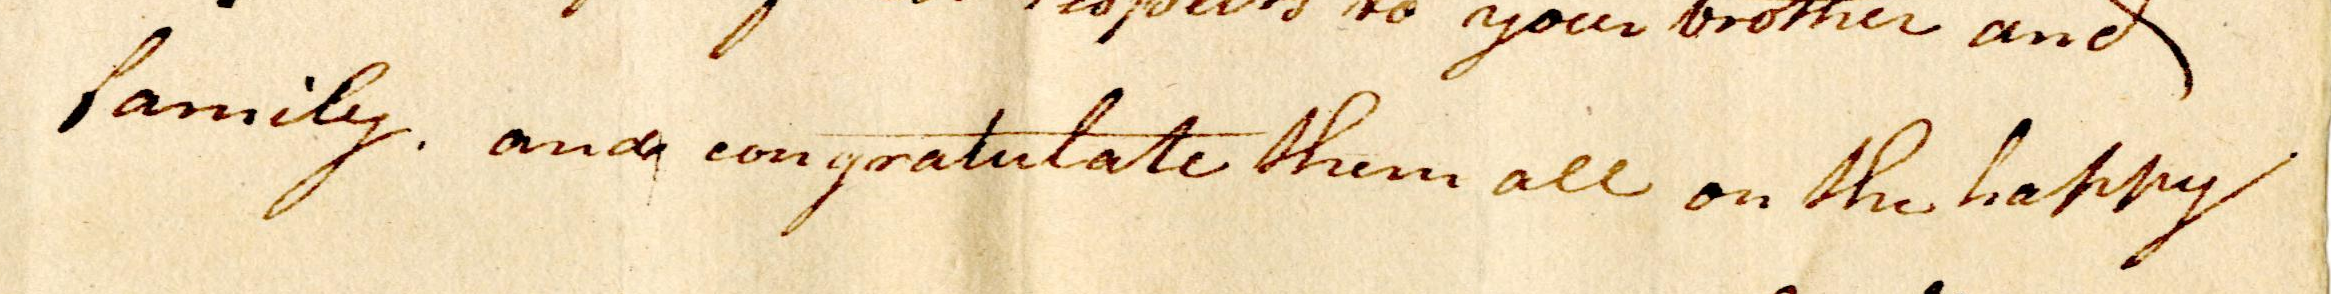Family. and congratulate them all on the happy
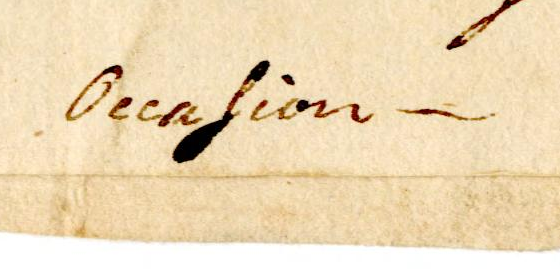occasion-
